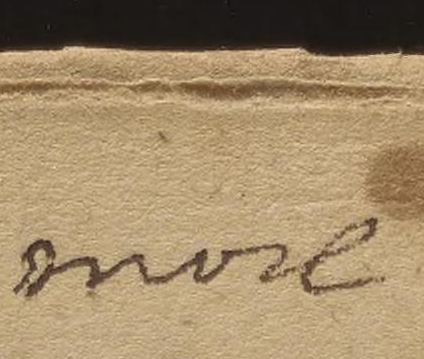more
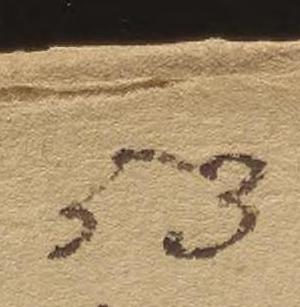53
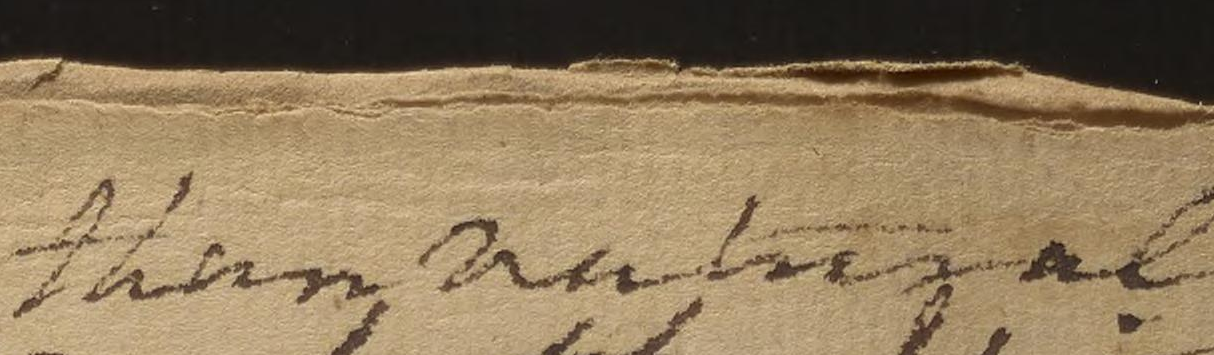than natural
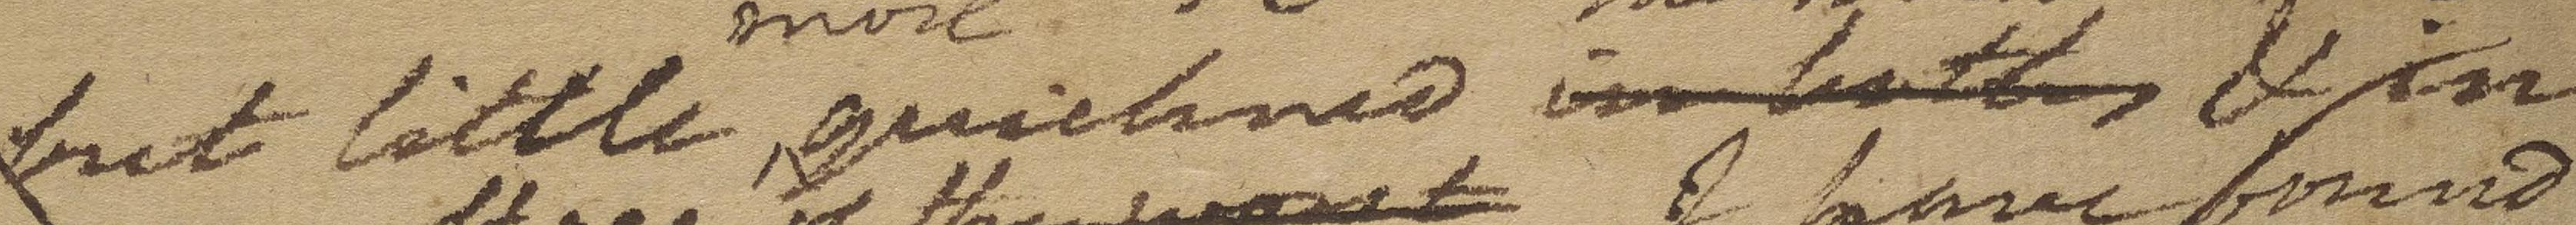but little ^ quickened [in hotter] & in
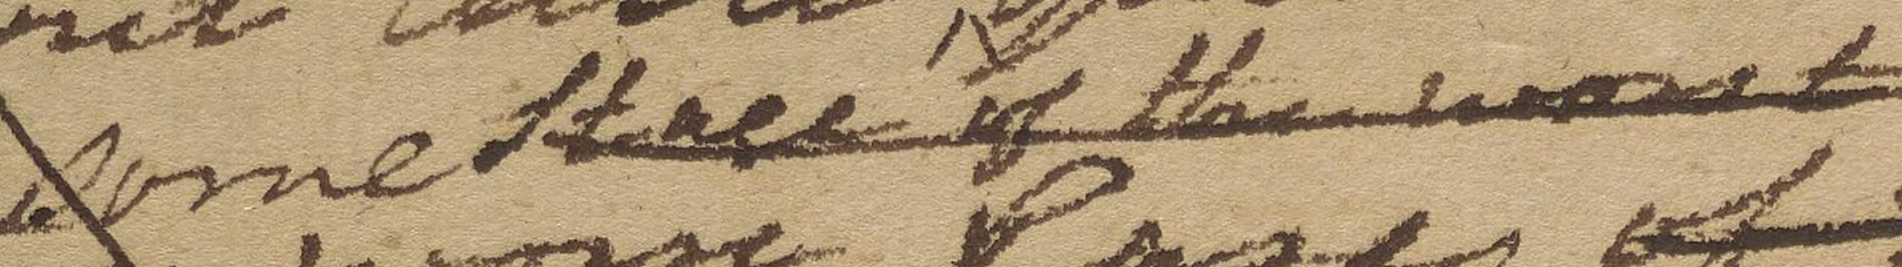some [stage of the worst]
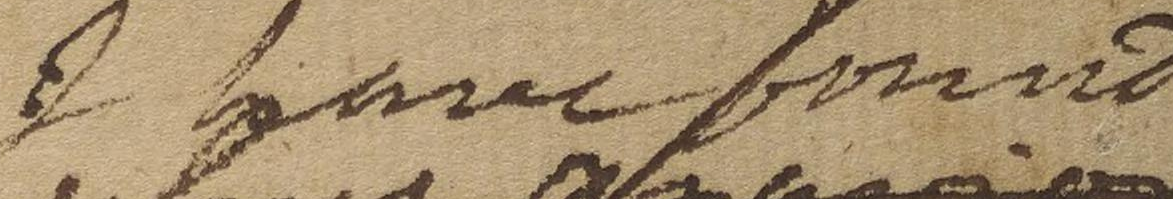I have found
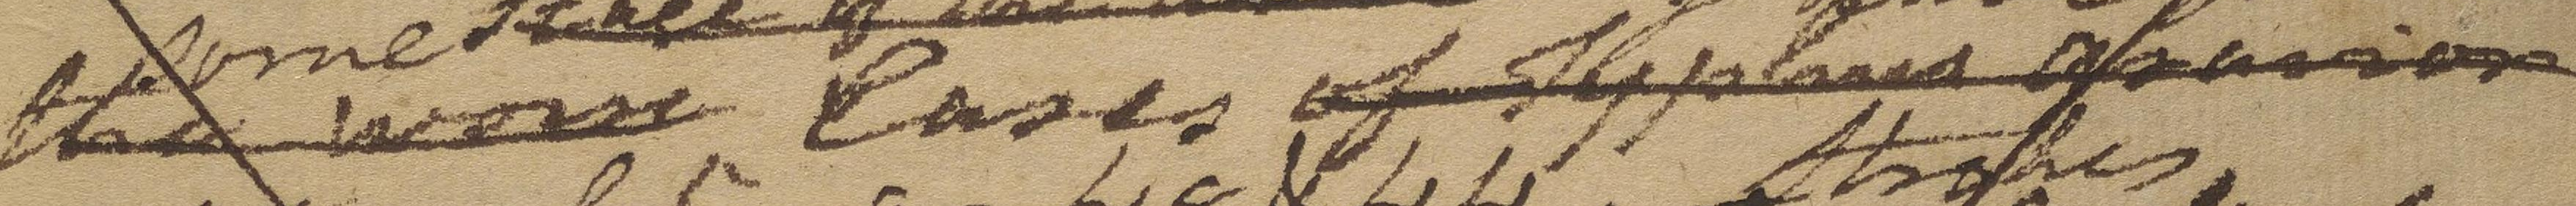[the worse] ^ cases [of Typhus gravior]
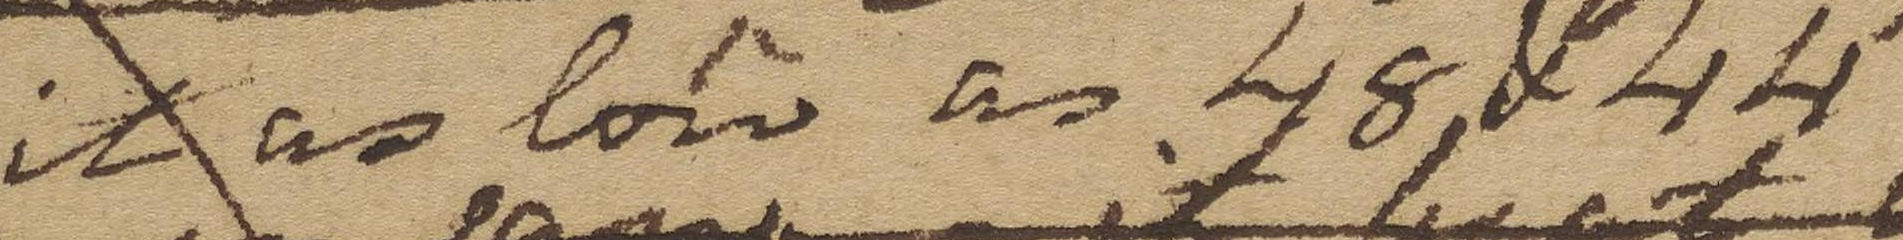it as low as 48 & 44
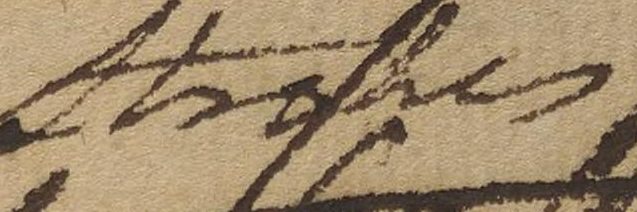strokes
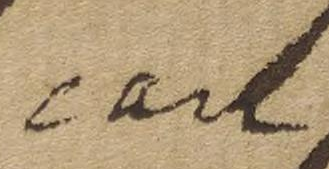can
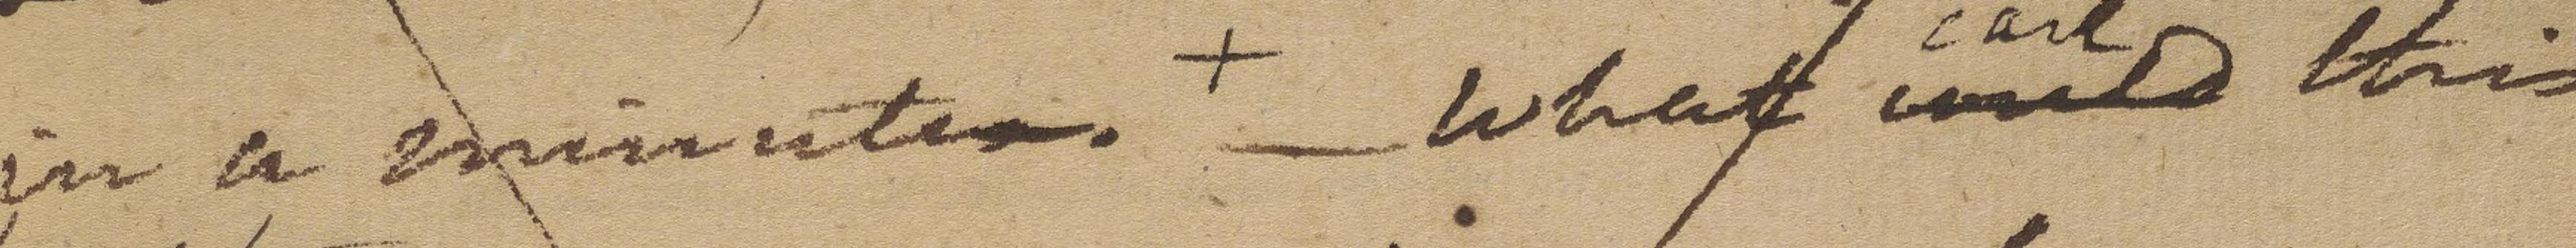in a minute. + What [could] this
